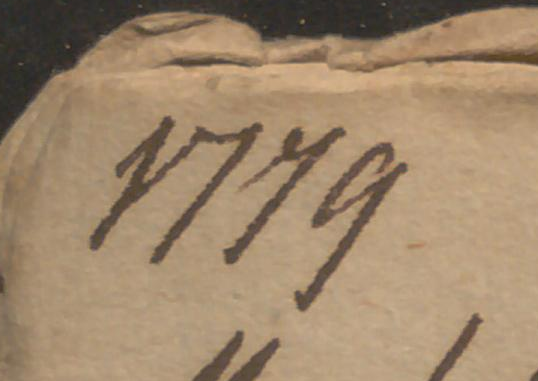1779
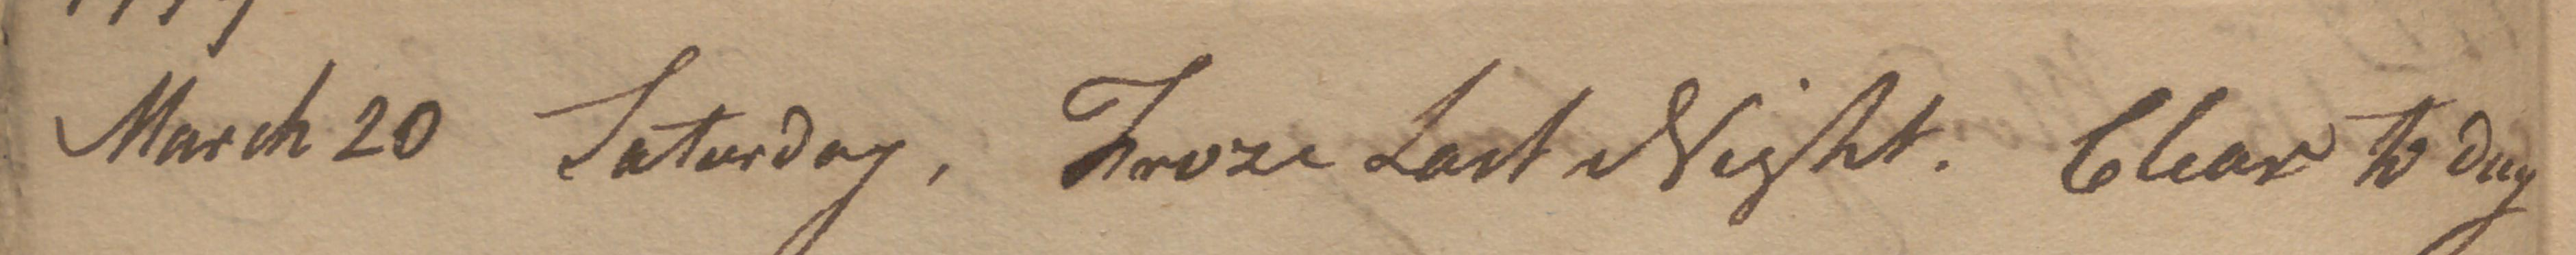March 20 Saturday. Froze Last Night. Clear to day
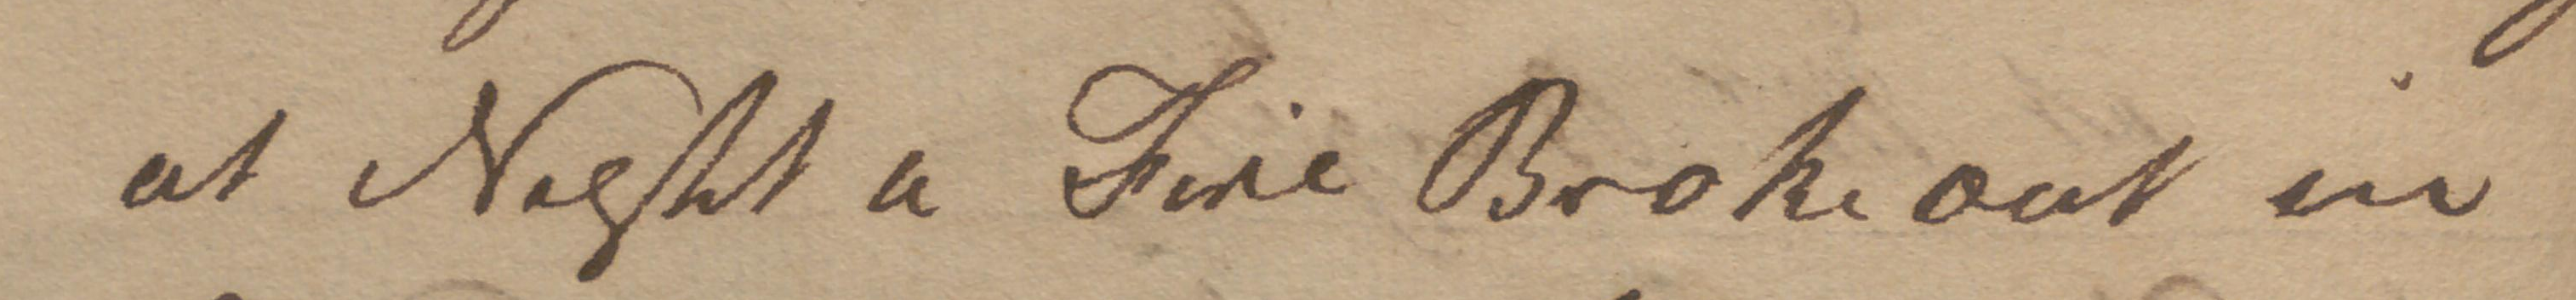at Night a Fire Broke out in
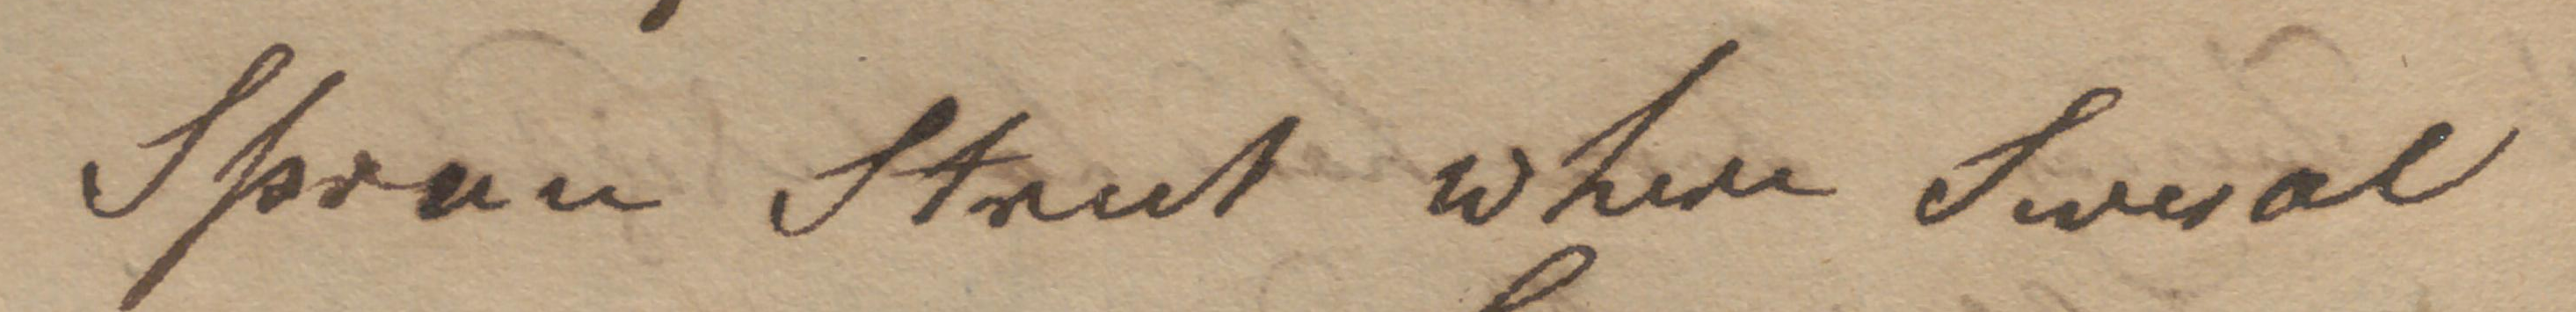Spruce Street where Several
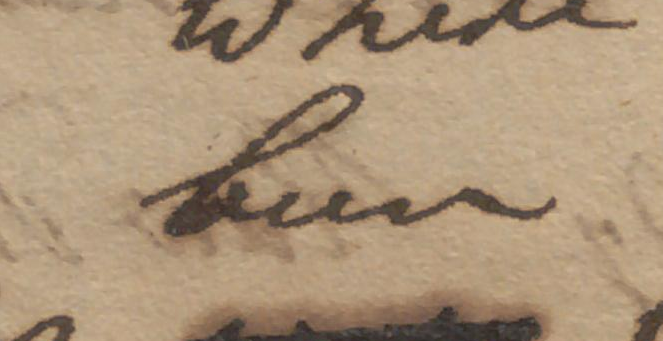been
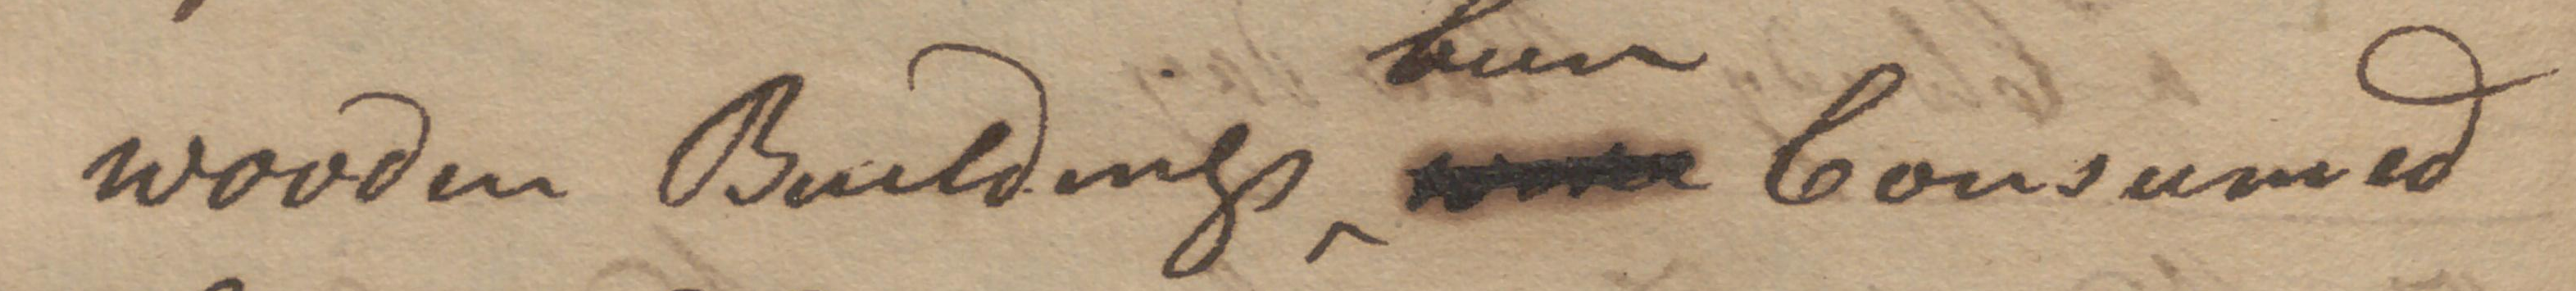wooden Buildings ^ [were] Consumed
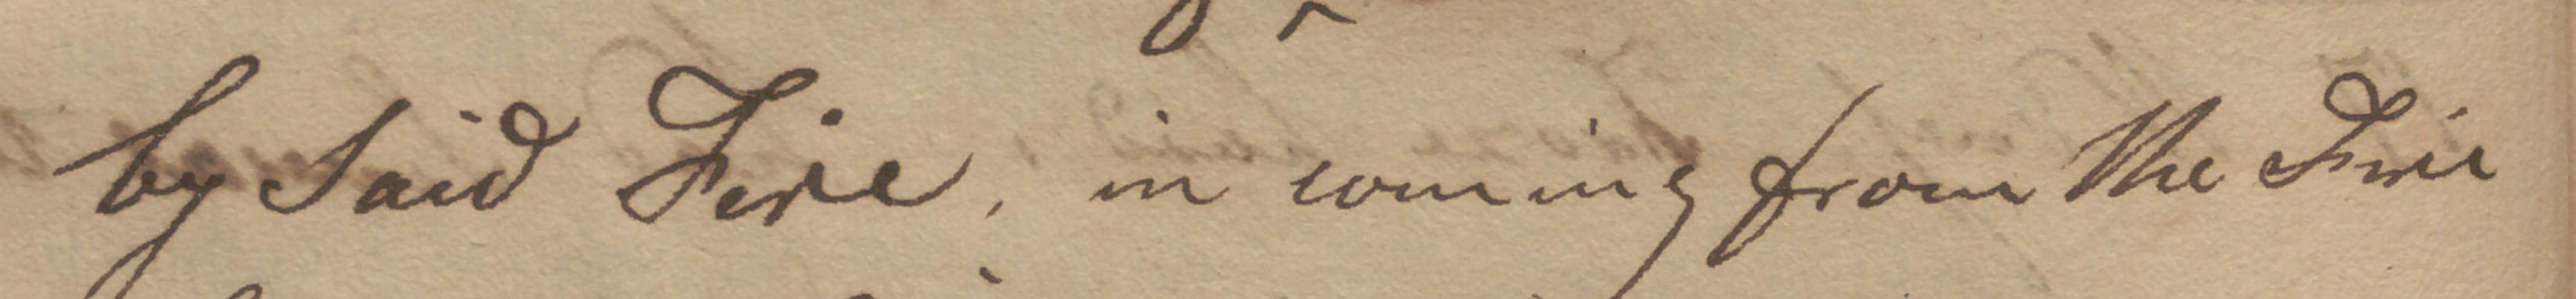by said Fire, in coming from the Fire
